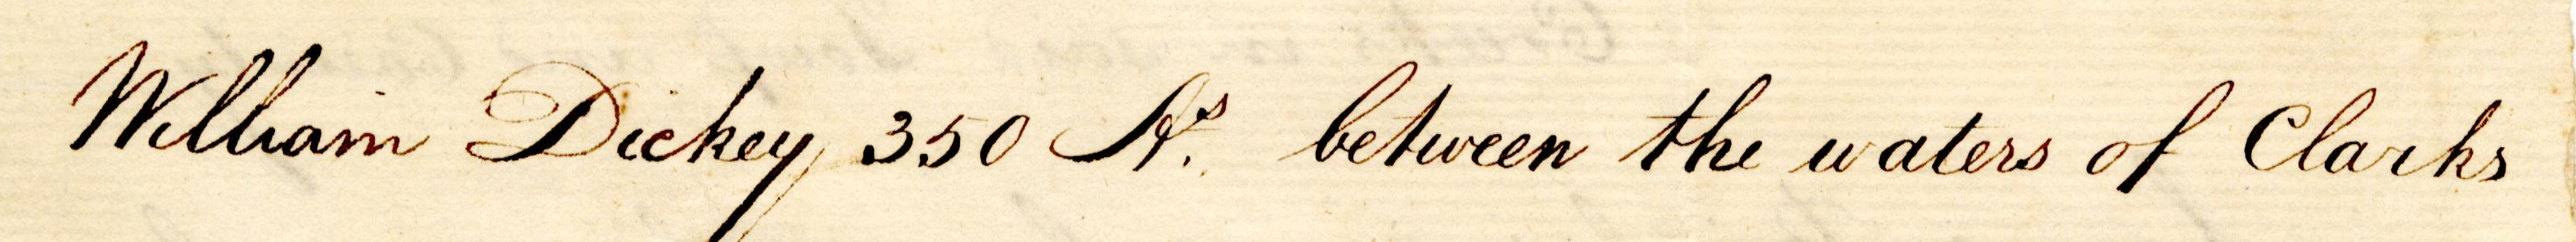William Dickey 350 A^s. between the waters of Clarks
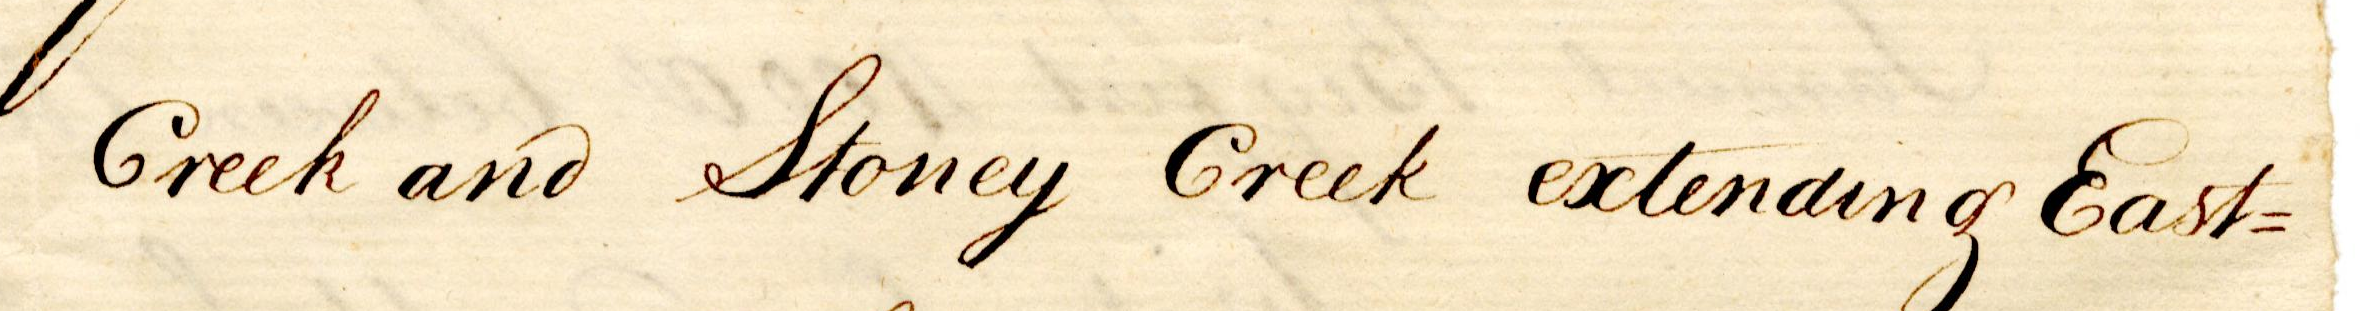Creek and Stoney Creek extending East-
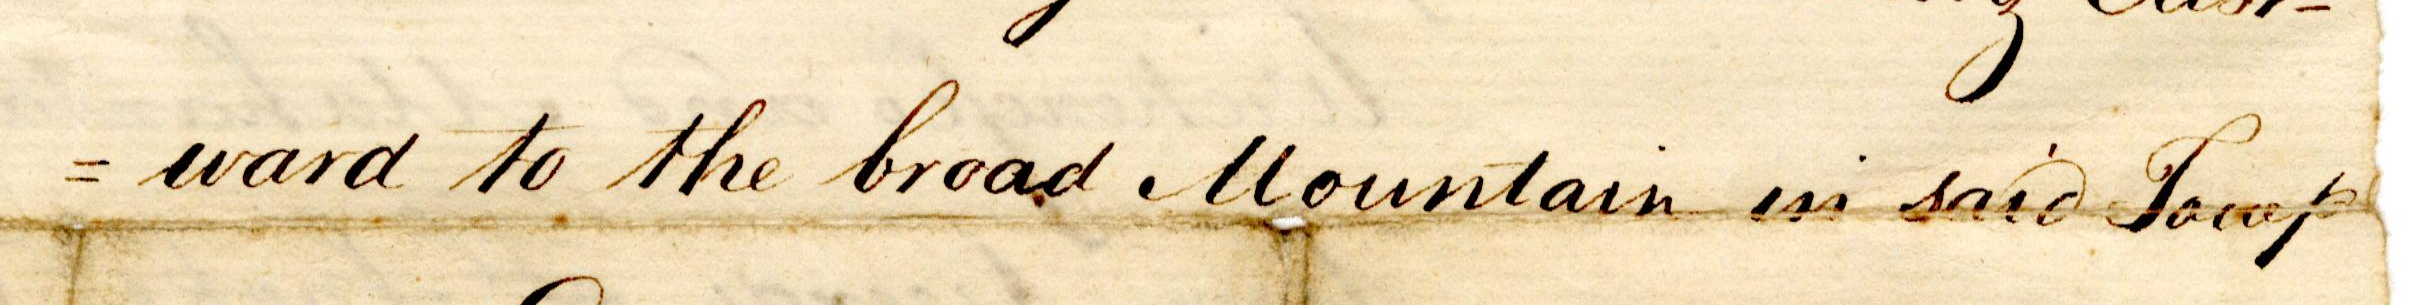-ward to the broad Mountain in said Tow^p
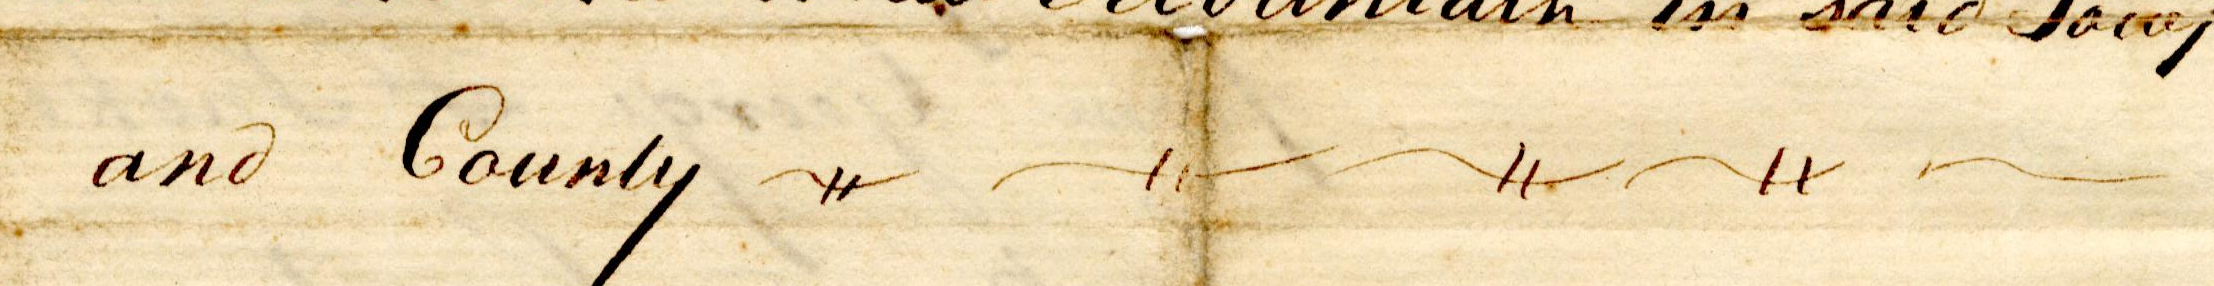and County-----
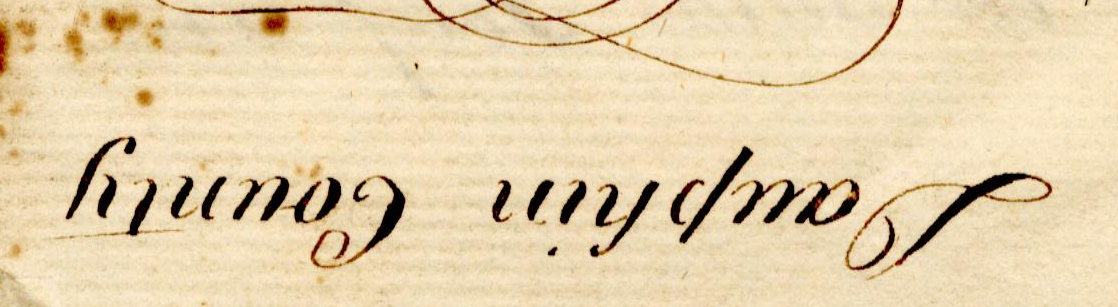Dauphin County
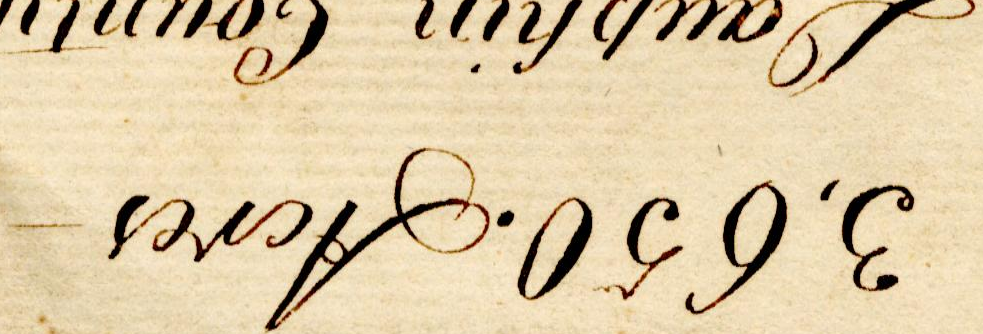3,650 Acres
